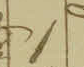1
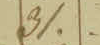31.
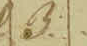3.
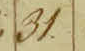31.
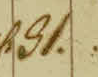31.
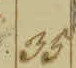35
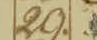29.
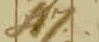47.
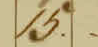15.
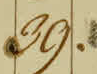39
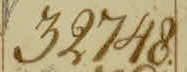32748.
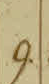9.
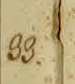33.
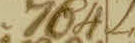764
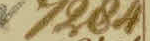7284.
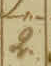2.
